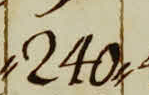240
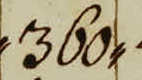360
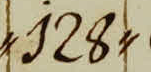128
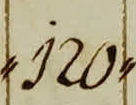120
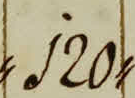120
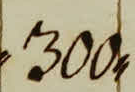300
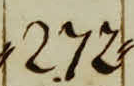272
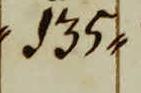135
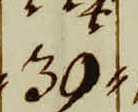39
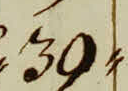39
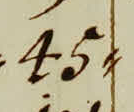45
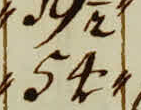54
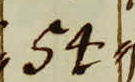54
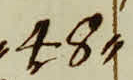48
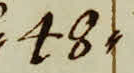48
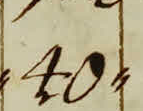40
